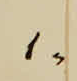1
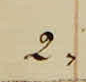2
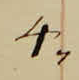4
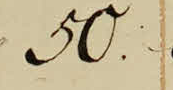50.
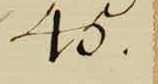45.
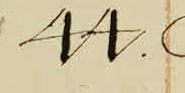44.
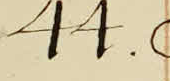44.
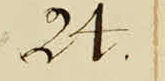24.
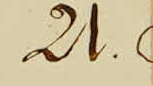21.
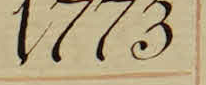1773
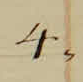4
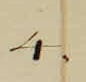4
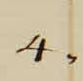4
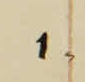1
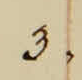3
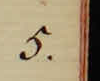5.
